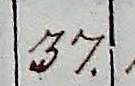37.
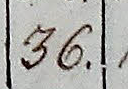36.
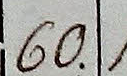60.
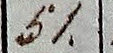51.
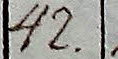42.
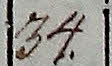34.
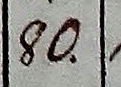80.
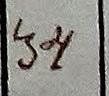34
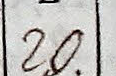20.
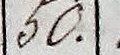50.
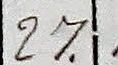27.
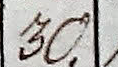30.
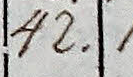42.
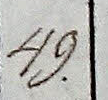49.
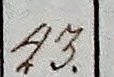43.
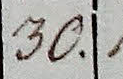30.
